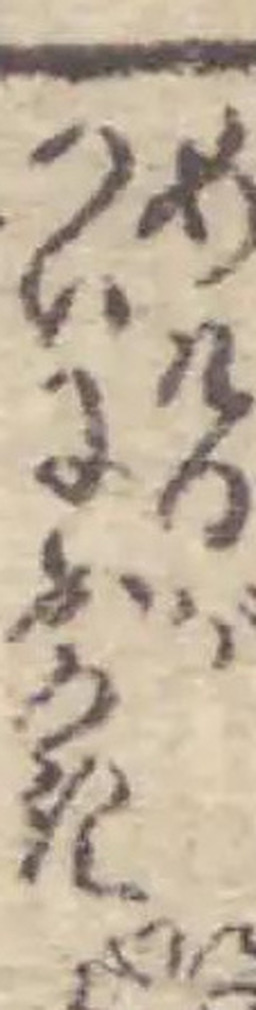ついにふかき
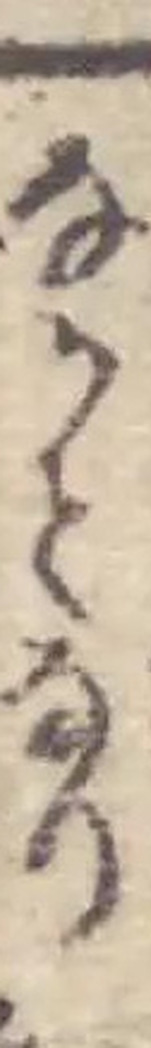なかとなり
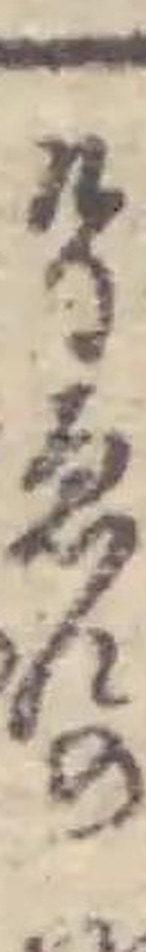けるゑんの
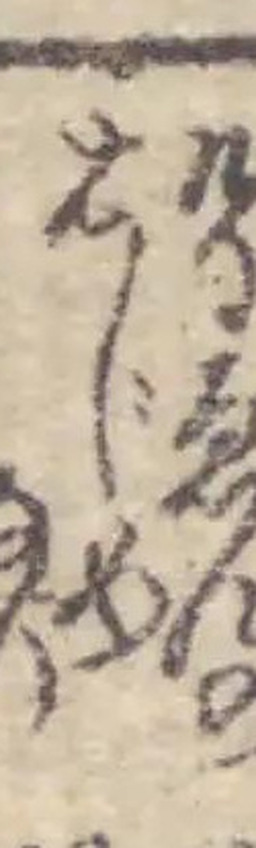はじめ
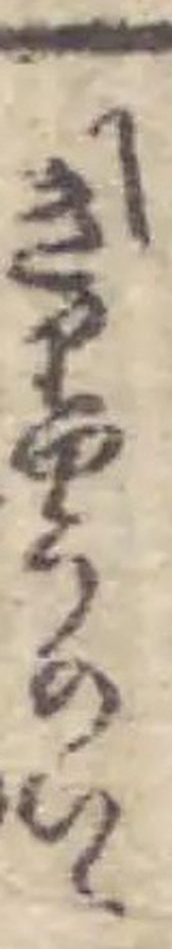〽きりやうのいゝ
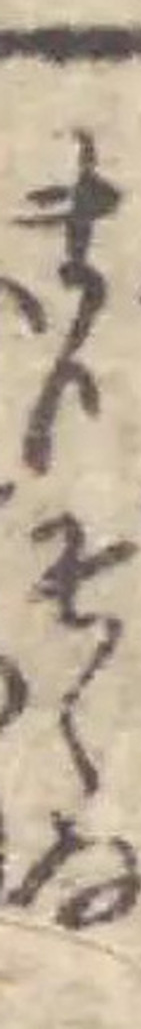まんそくな
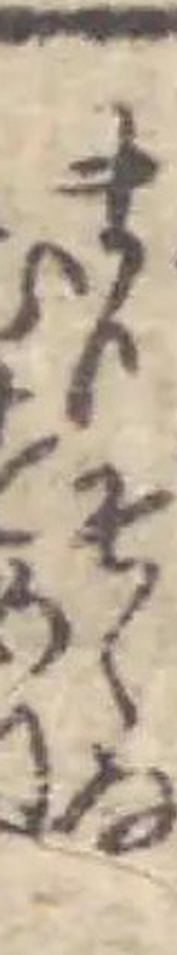まんそくな
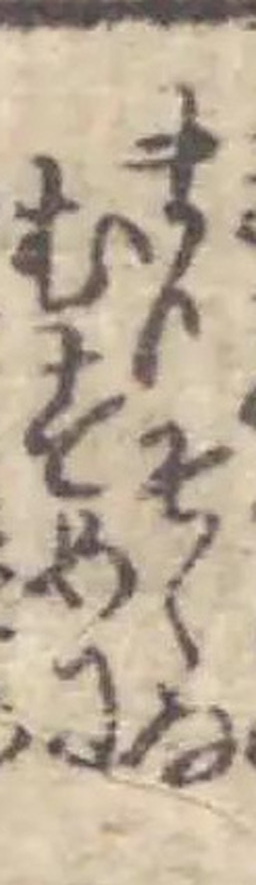むすめに
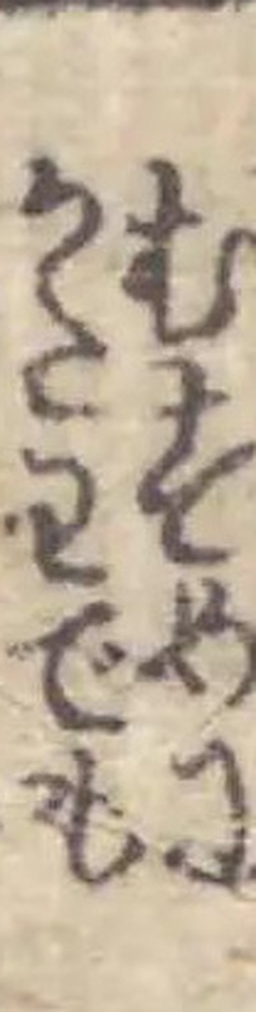かたわでも
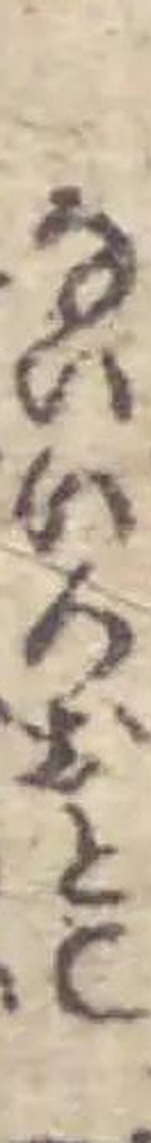ないいろおとこ
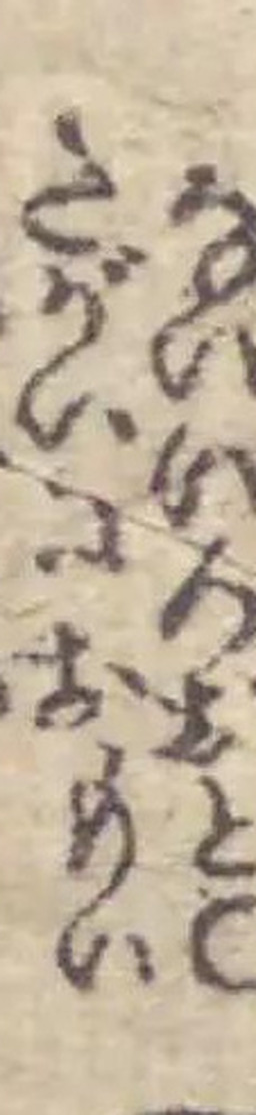たがいにおもい
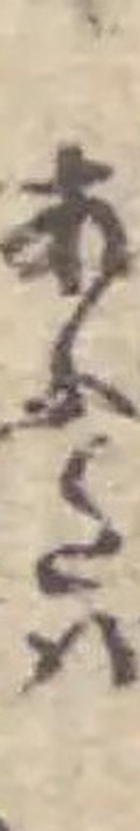あふたは
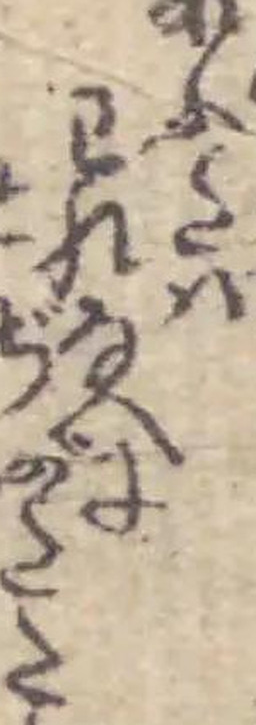われなへに
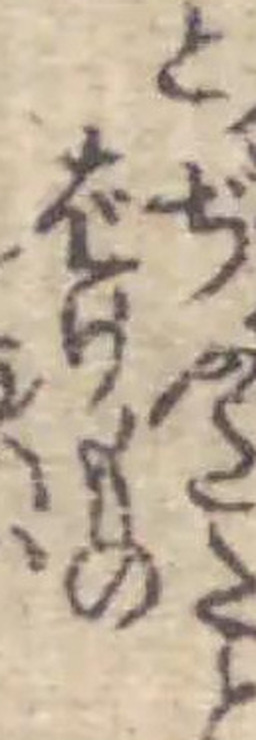ばけもの
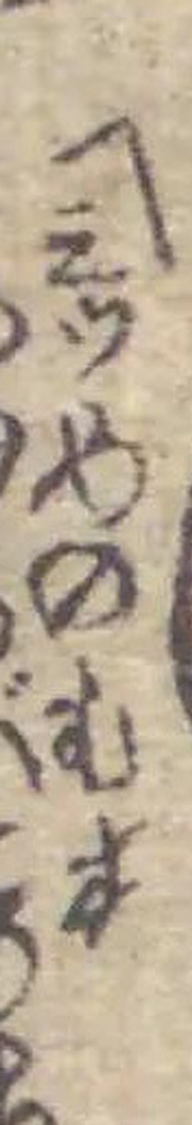〽三ッめのむす
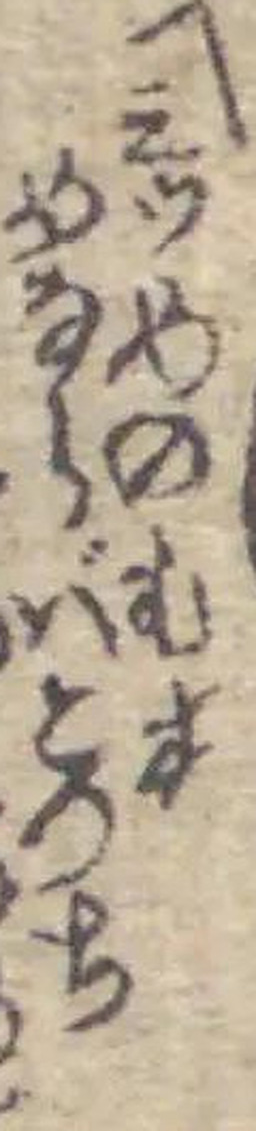めならばこつち
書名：化物尽 4巻
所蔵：国立国会図書館 National Diet Library, JAPAN
